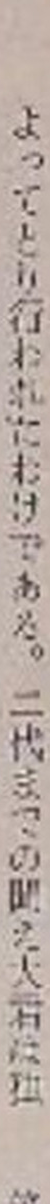よってとり行われたわけである。二代までの聞え大君は独
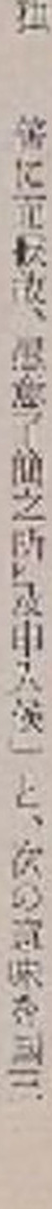筈に而候故、愚意了簡之所及申入候」と、次の意味を国王
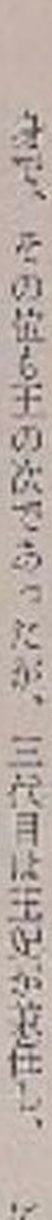身で、その位も王の次であったが、三代目は王妃が兼任し、
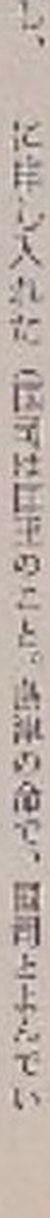に申し入れた(国司は国王のこと。島津の命で、国司とよんでい
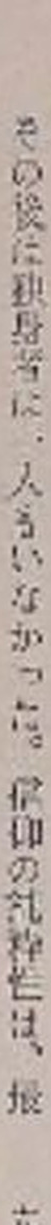その後は独身者は一人もいなかった。信仰の純粋性は、最
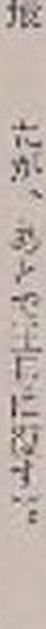たが、あとで王号に覆す)。
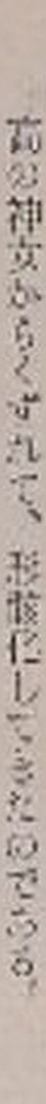高の神女からくずれて、形骸化してきたのである。
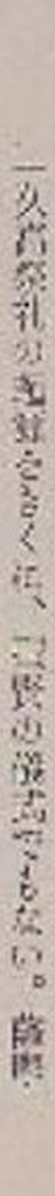「久高祭礼の趣旨をきくに、聖賢の儀式でもない。薩摩
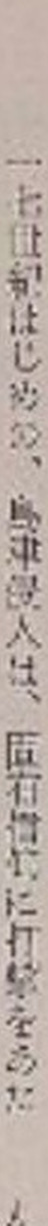一七世紀はじめの、島津侵入は、固有信仰に打撃をあた
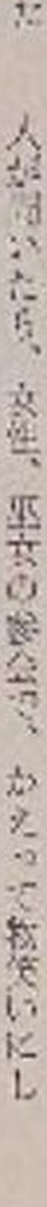人が聞いたら、女性、巫女の参会で、かえって物笑いにし
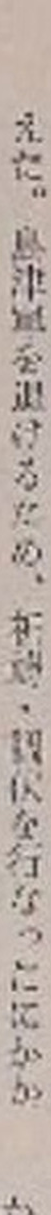えた。島津軍を退けるため、祈祷・調伏を行なったにかか
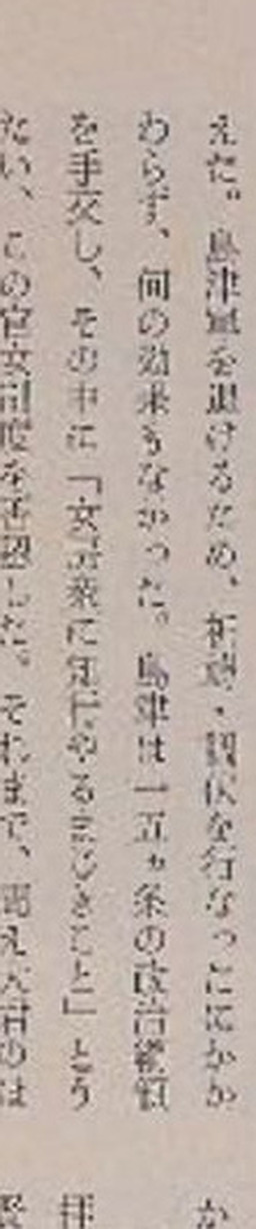わらず、何の効果もなかった。島津は一五ヵ条の政治領
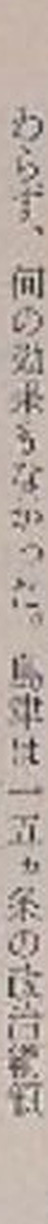わらず、何の効果もなかった。島津は一五ヵ条の政治領
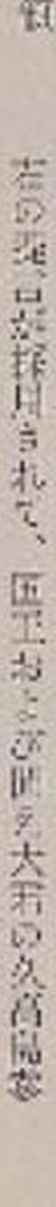右の提言が採用されて、国王および聞え大君の久高島参
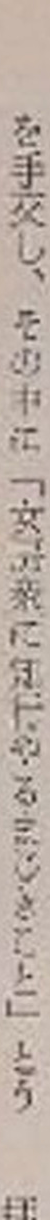を手交し、その中に「女房衆に知行やるまじきこと」とう
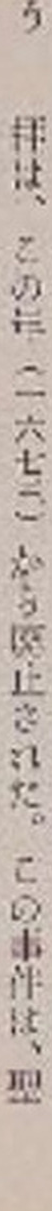拝は、この年(一六七三)から廃止された。この事件は、聖
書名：沖縄固有信仰のおとろえ
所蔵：University of the Ryukyus Library
